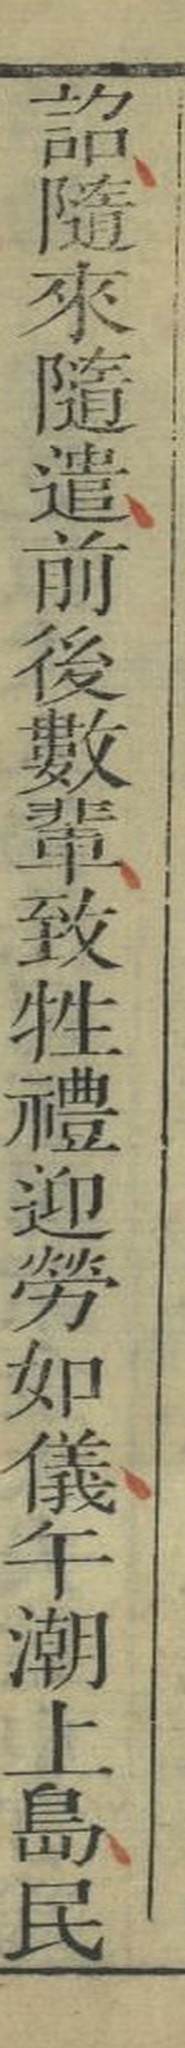詔隨來隨遣前後數輩致牲禮迎勞如儀午潮上島民
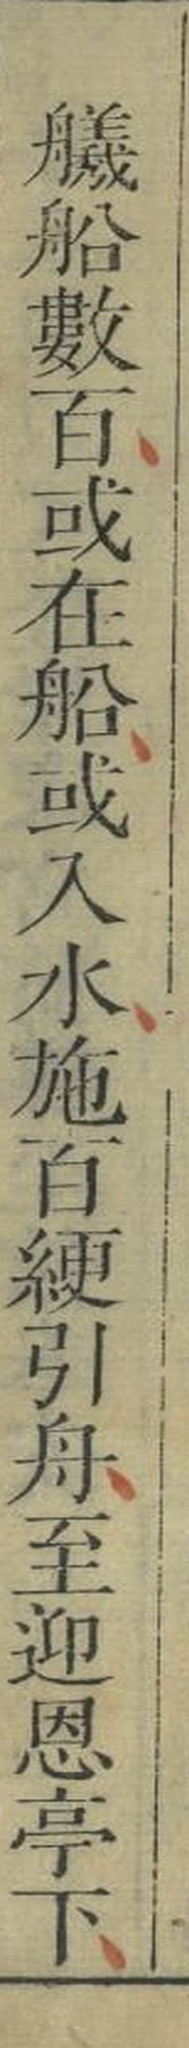艤船數百或在船或入水施百綆引舟至迎恩亭下

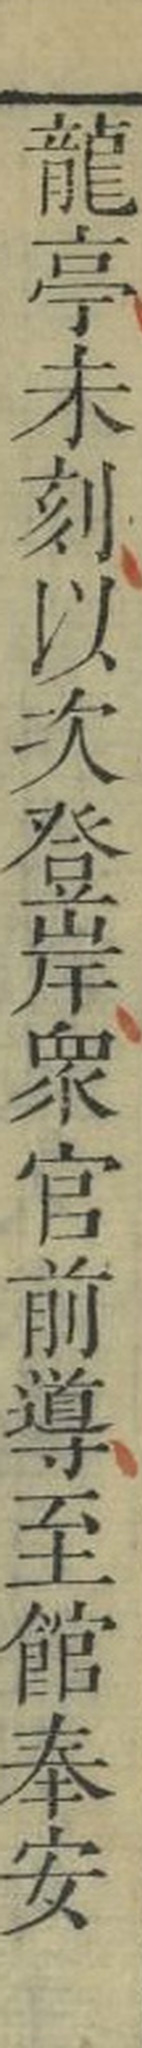龍亭未刻以次登岸衆官前導至館奉安
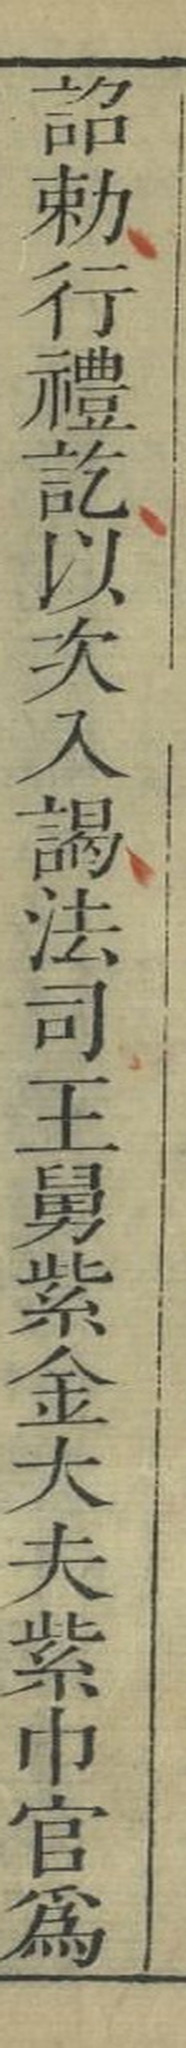詔勅行禮訖以次入謁法司王舅紫金大夫紫巾官爲
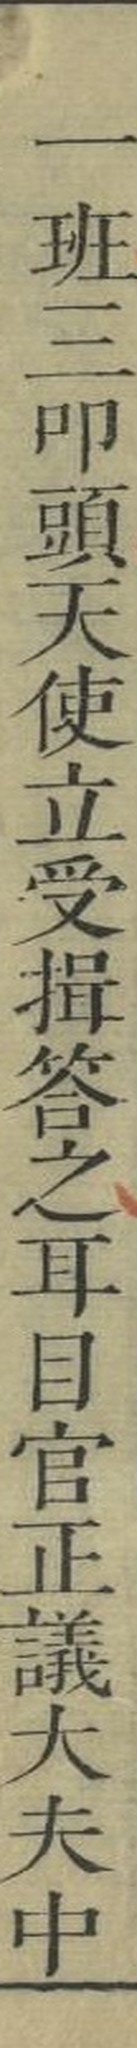一班三叩頭天使立受揖答之耳目官正議大夫中
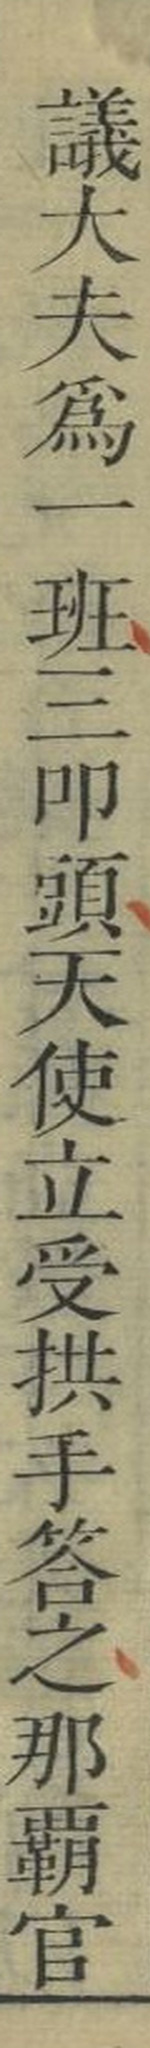議大夫爲一班三叩頭天使立受拱手答之那覇官
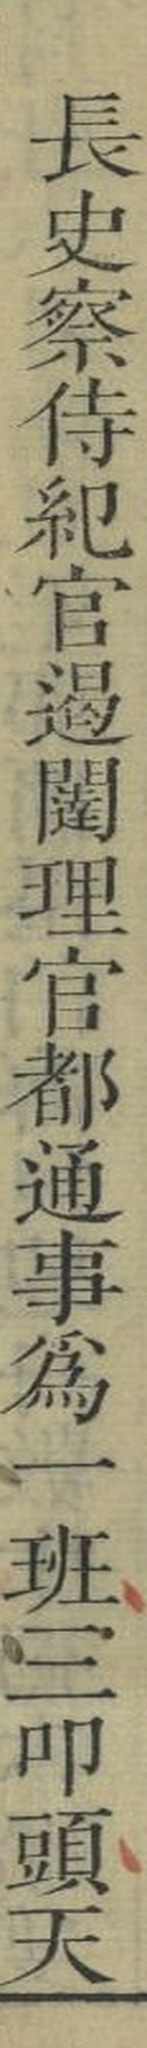長史察侍紀官遏闥理官都通事爲一班三叩頭天
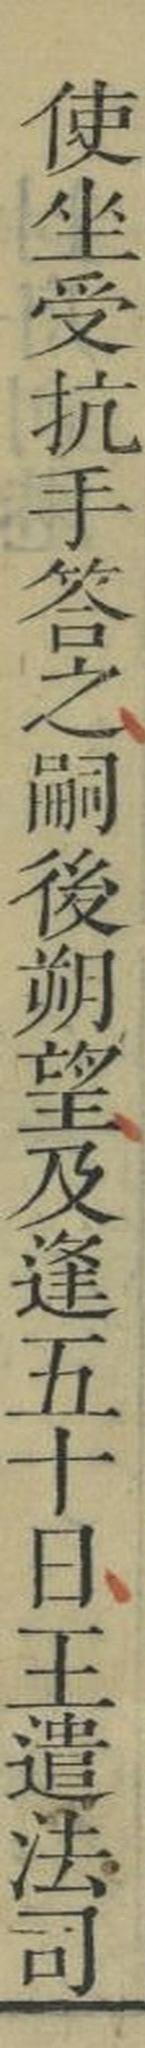使坐受抗手答之嗣後朔望及逢五十日王遣法司
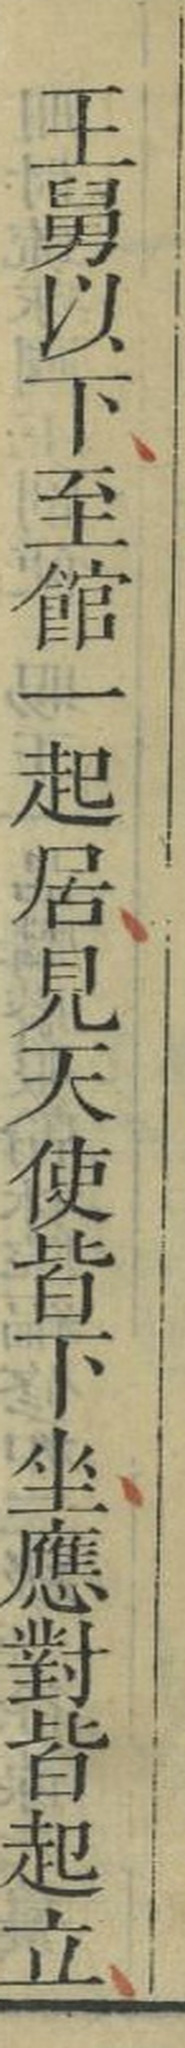王舅以下至館一起居見天使皆下坐應對皆起立
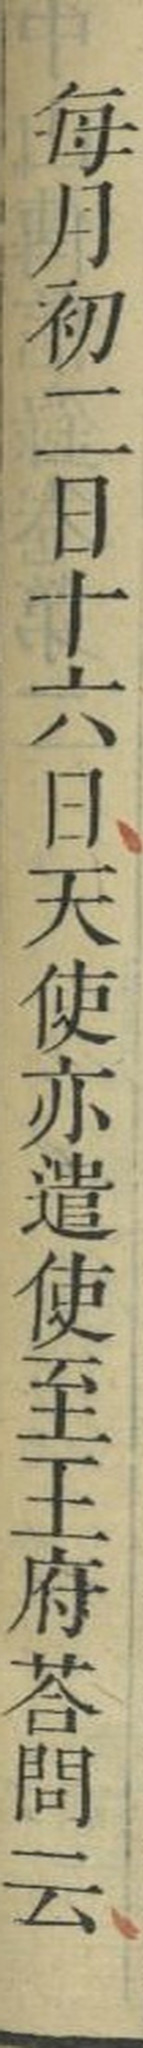每月初二日十六日天使亦遣使至王府荅問云

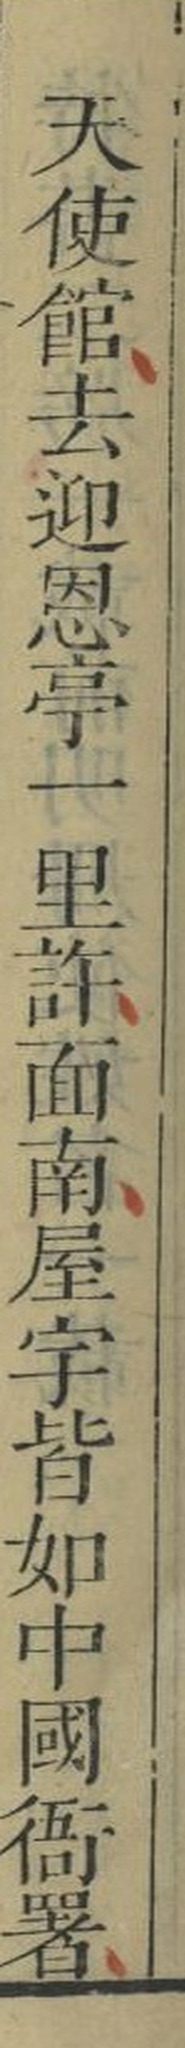天使館去迎恩亭一里許面南屋宇皆如中國衙署
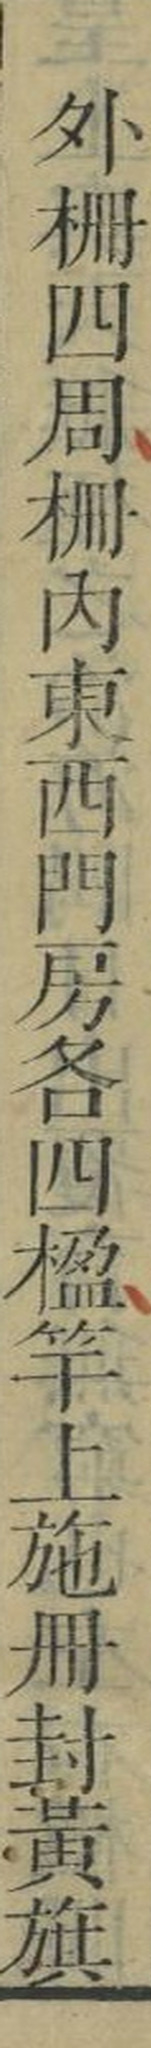外柵四周柵内東西門房各四楹竿上施冊封黃旗
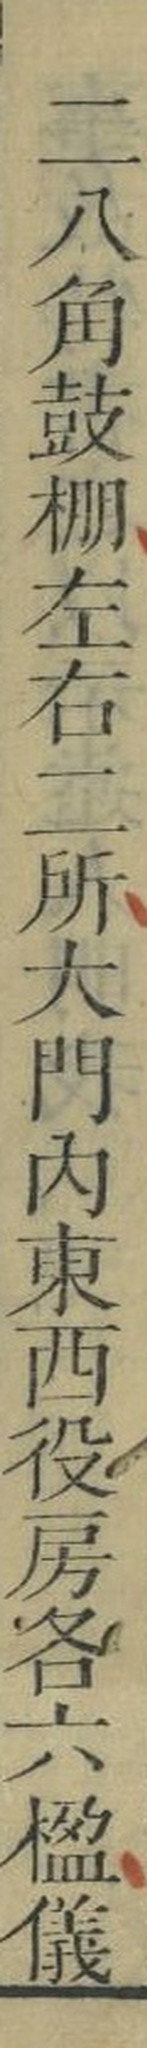二八角鼓棚左右二所大門内東西役房各六楹儀
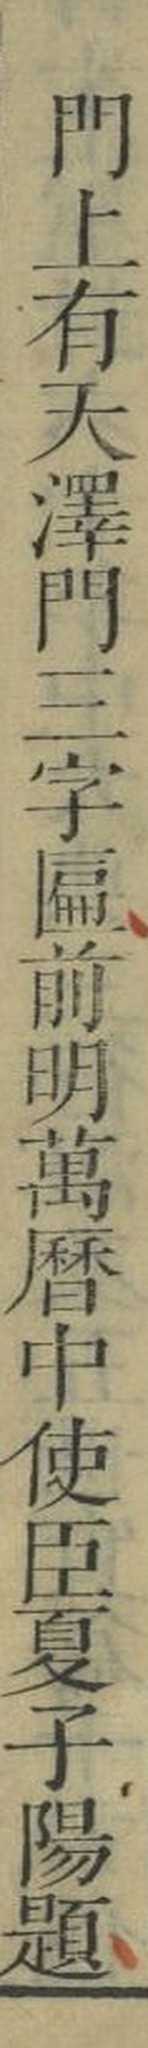門上有天澤門三字匾前明萬曆中使臣夏子陽題
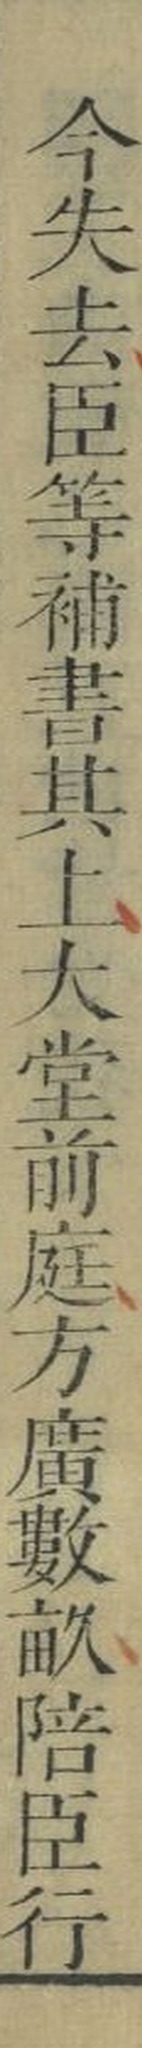今失去臣等補書其上大堂前庭方廣數畝陪臣行
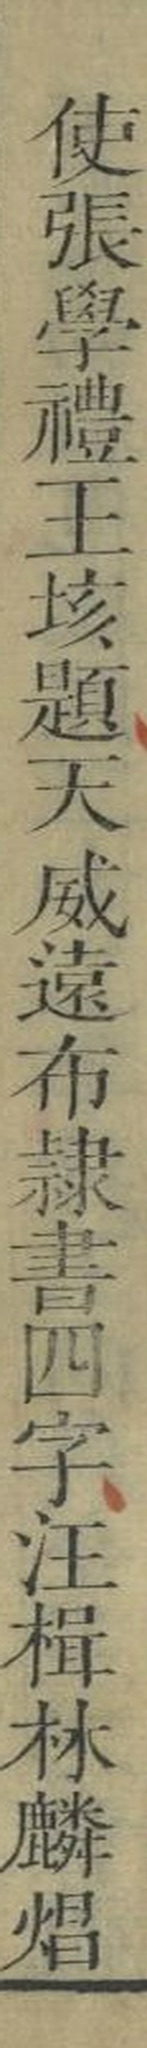使張學禮王垓題天威遠布隷書四字汪楫林麟焻
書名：中山伝信録 巻一、巻二
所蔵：University of the Ryukyus Library
